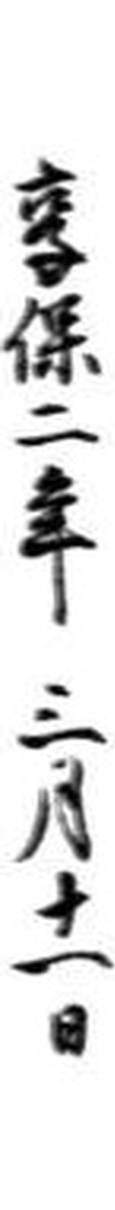享保二年三月十一日
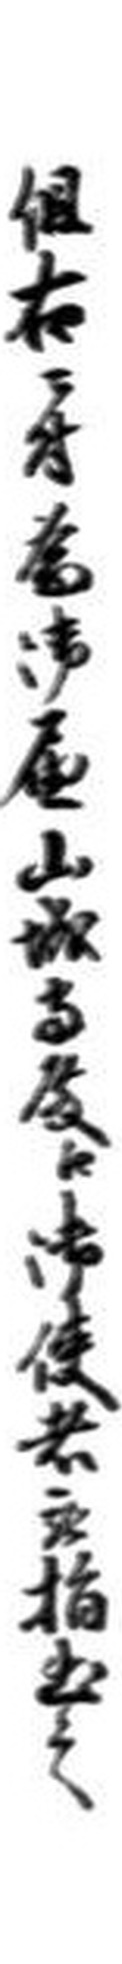但右ニ付為御届山城守殿江御使者被指出之
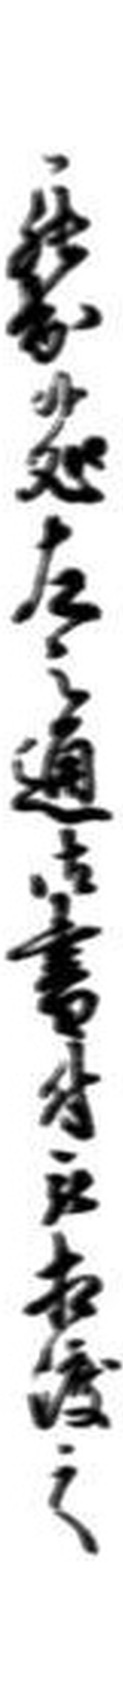罷出候処左之通御書付被相渡之
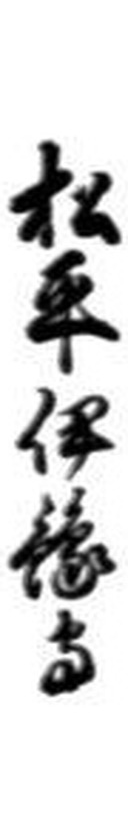松平伊予守
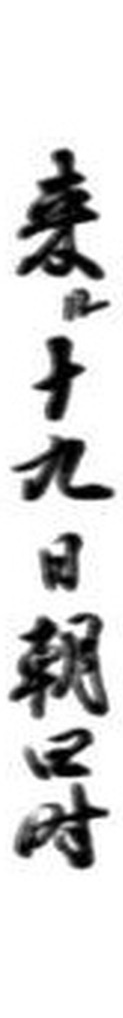来ル十九日朝四時

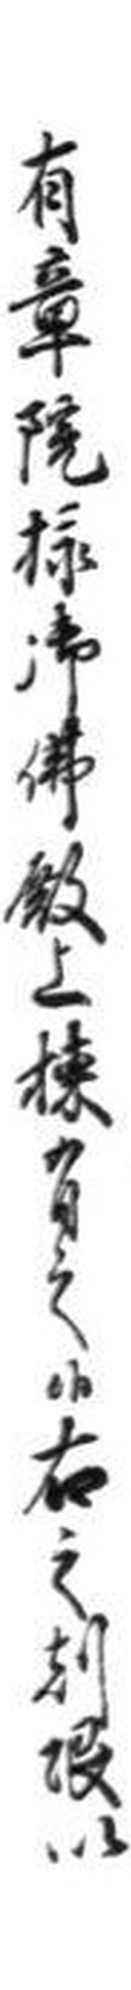有章院様御仏殿上棟有之候右之刻限以
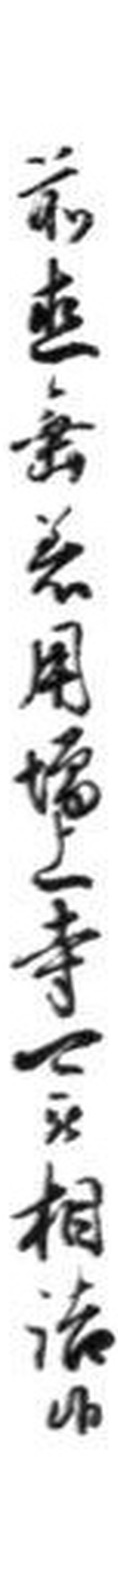前直垂着用増上寺可被相詰候
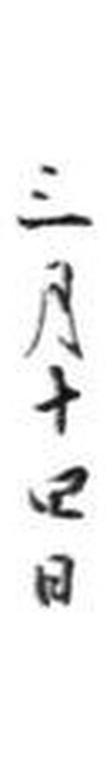三月十四日
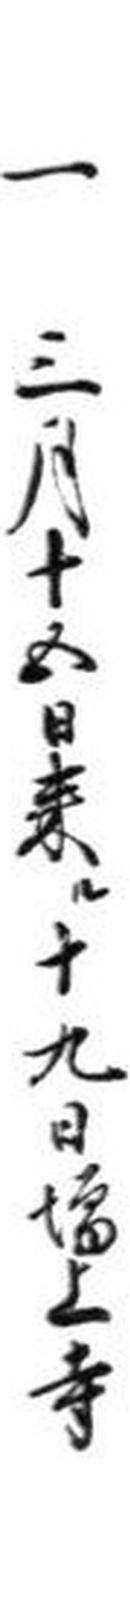一三月十五日来ル十九日増上寺
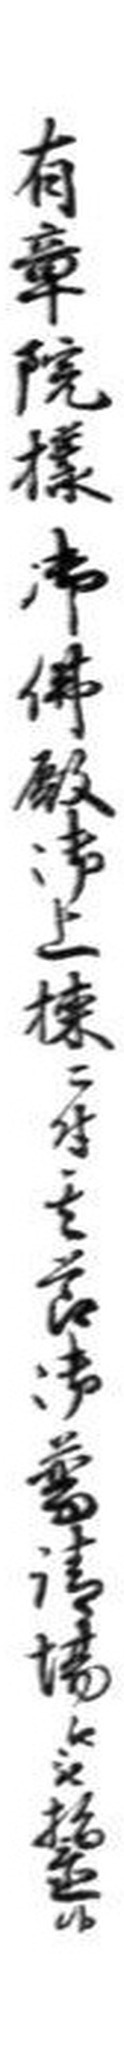有章院様御仏殿御上棟ニ付其節御普請場江被指置候
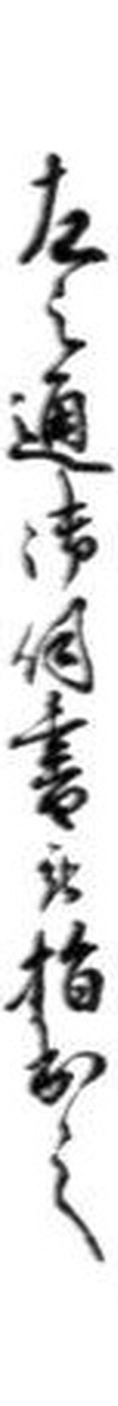左之通御伺書被指出之
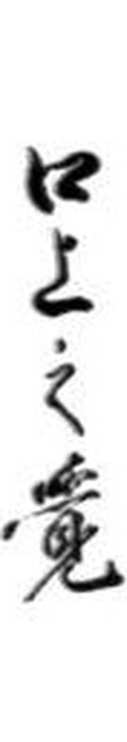口上之覚
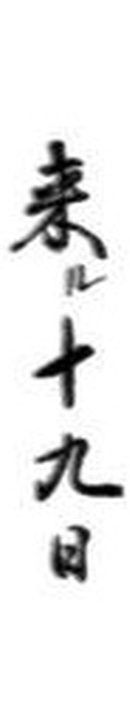来ル十九日
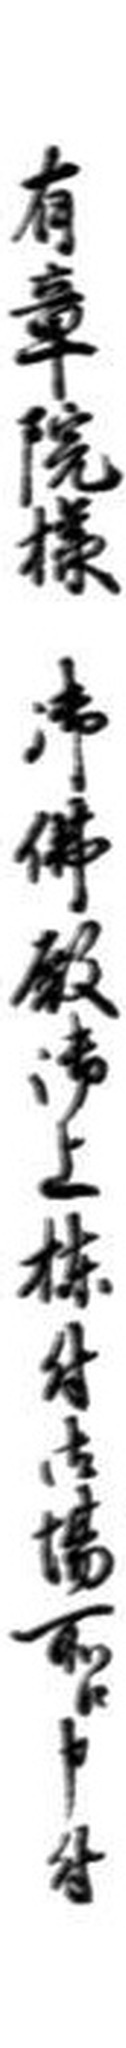有章院様御仏殿御上棟付御場所江申付
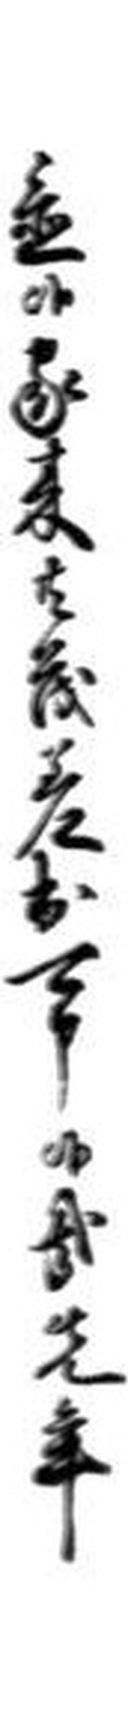置候家来共茂差出可申候哉先年
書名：家譜 三十二 吉邦公 従享保二年到享保三年
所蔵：福井県文書館 Fukui Prefectural Archives
